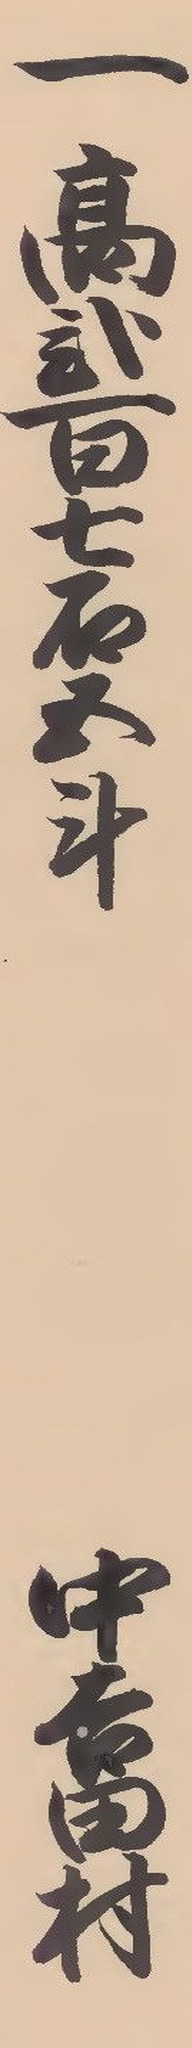一高弐百七石五斗中吉田村
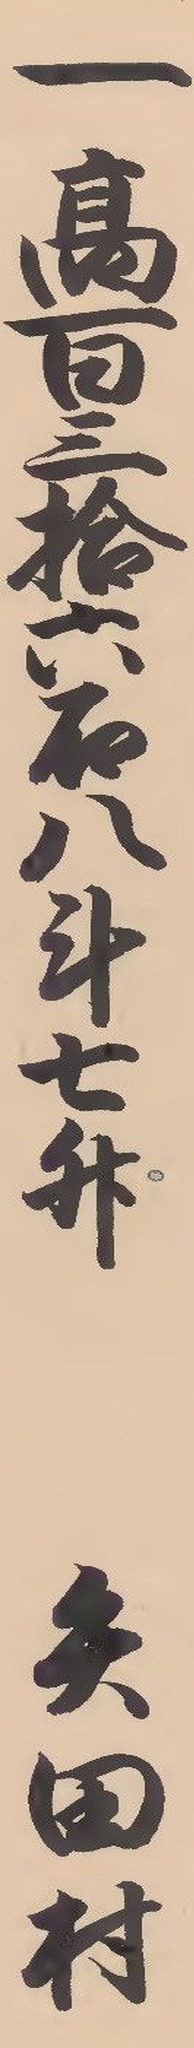一高百三拾六石八斗七升矢田村

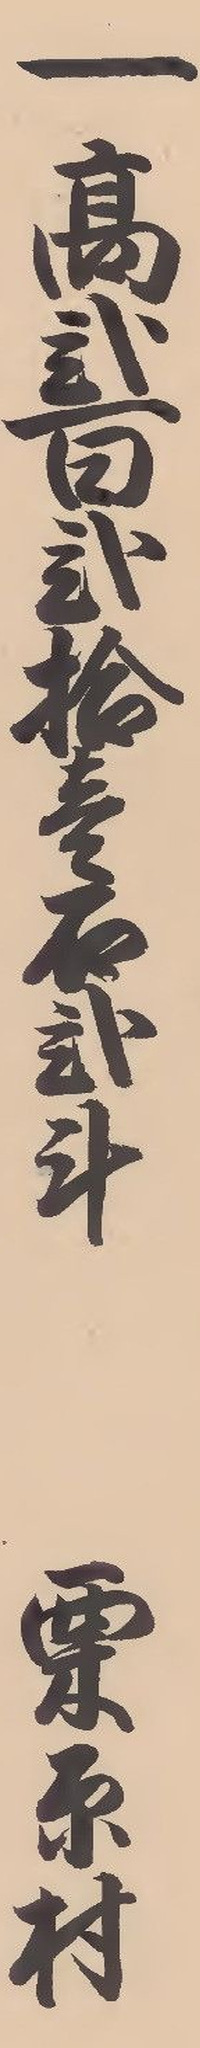一高弐百弐拾壱石弐斗栗原村
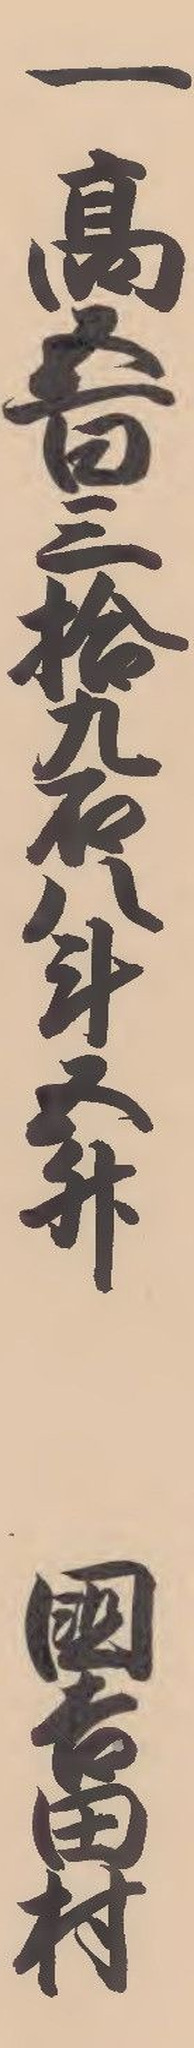一高五百三拾九石八斗五升国吉田村
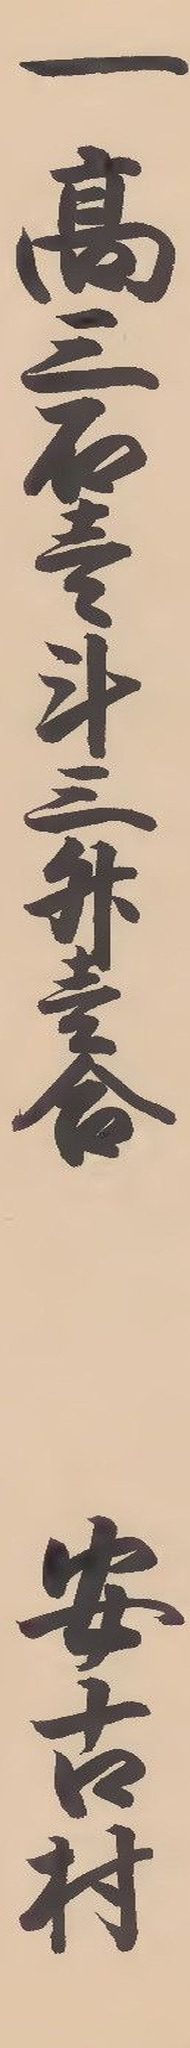一高三石壱斗三升壱合安古村
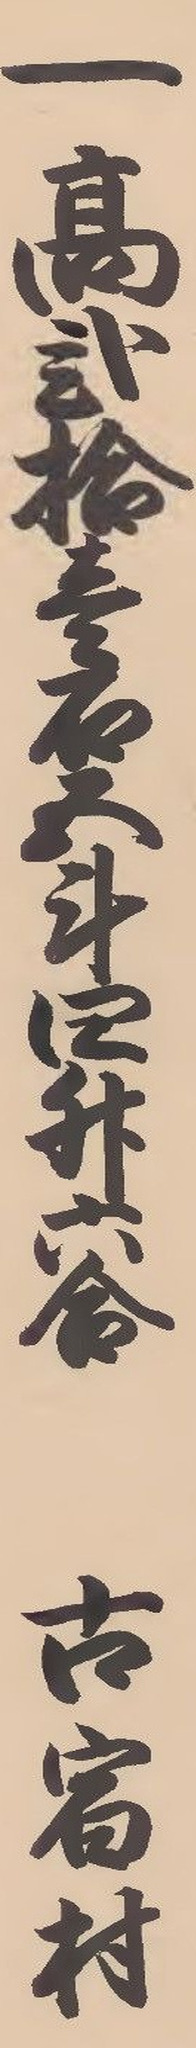一高弐拾壱石五斗四升六合古宿村
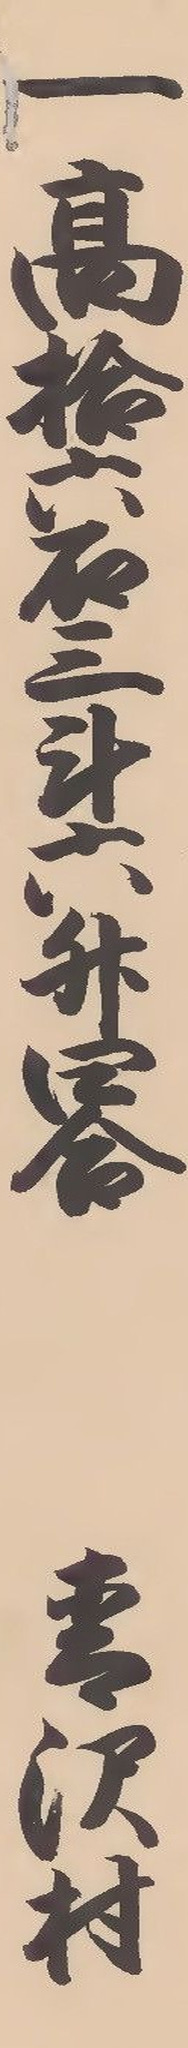一高拾六石三斗六升四合青沢村
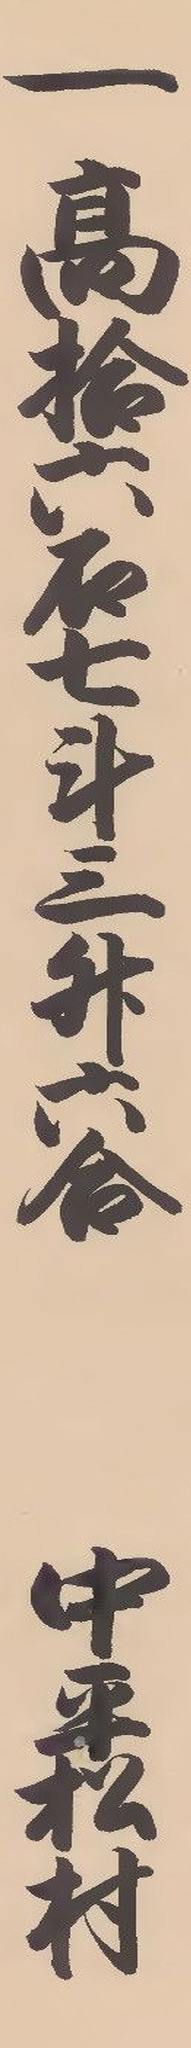一高拾六石七斗三升六合中平松村

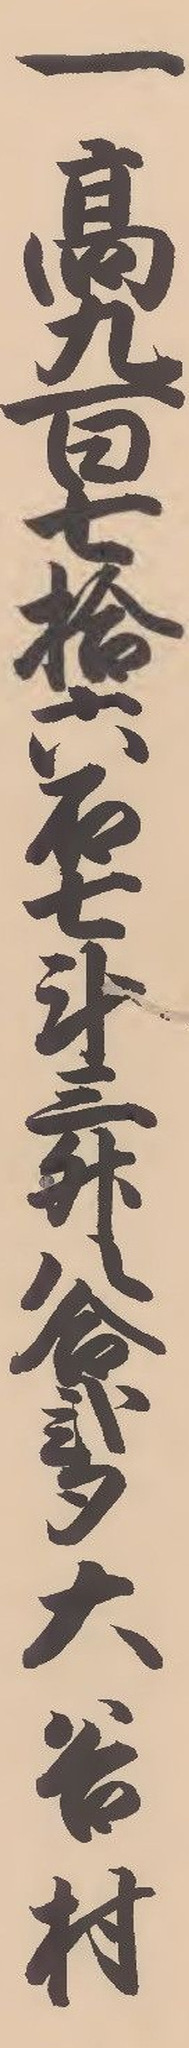一高九百七拾六石七斗三升八合弐勺大谷村
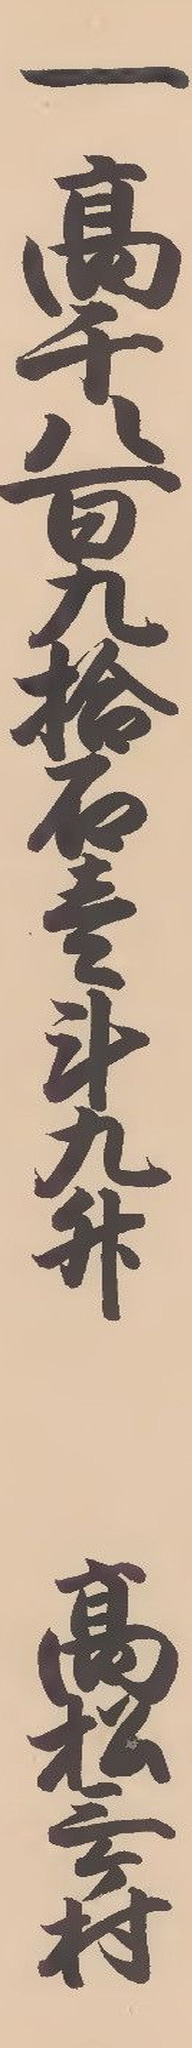一高千八百九拾石壱斗九升高松三ヶ村
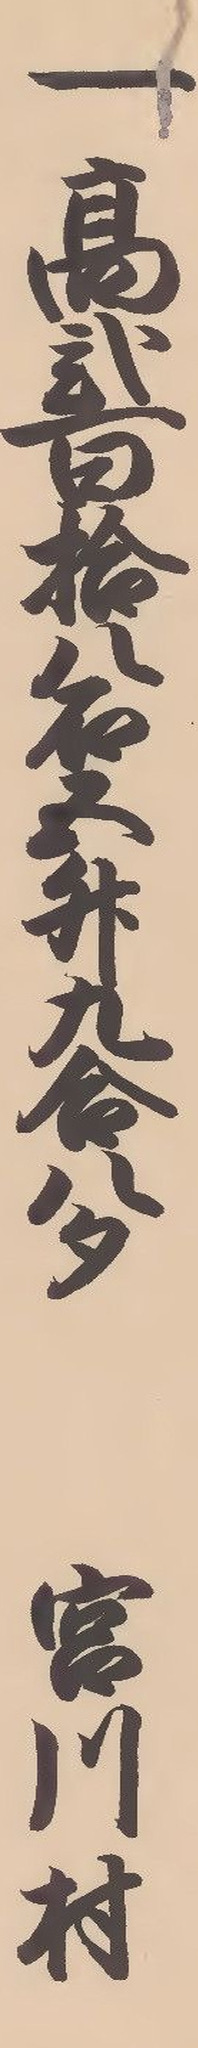一高弐百拾八石五升九合八勺宮川村
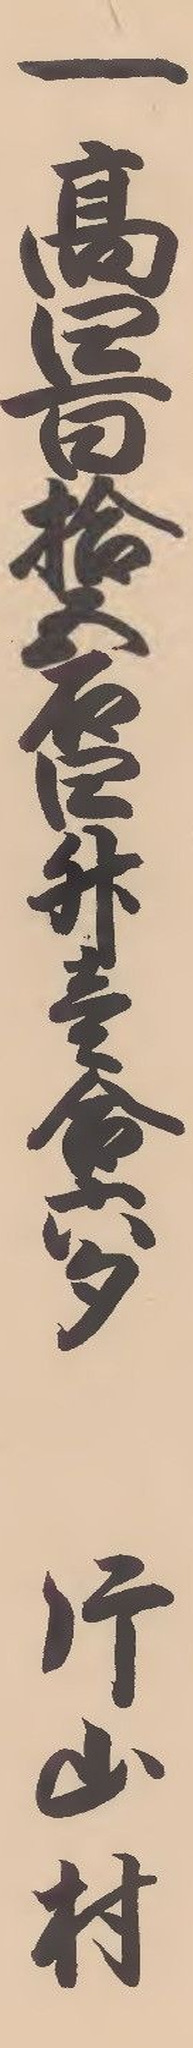一高四百拾五石四升壱合六勺片山村
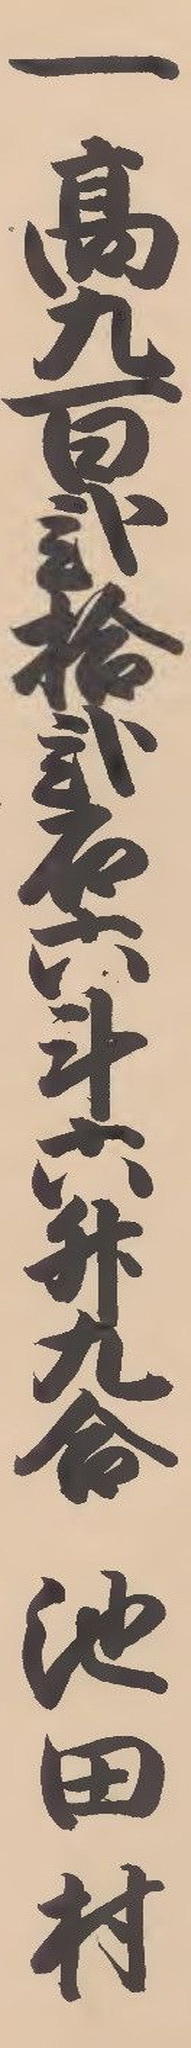一高九百弐拾弐石六斗六升九合池田村
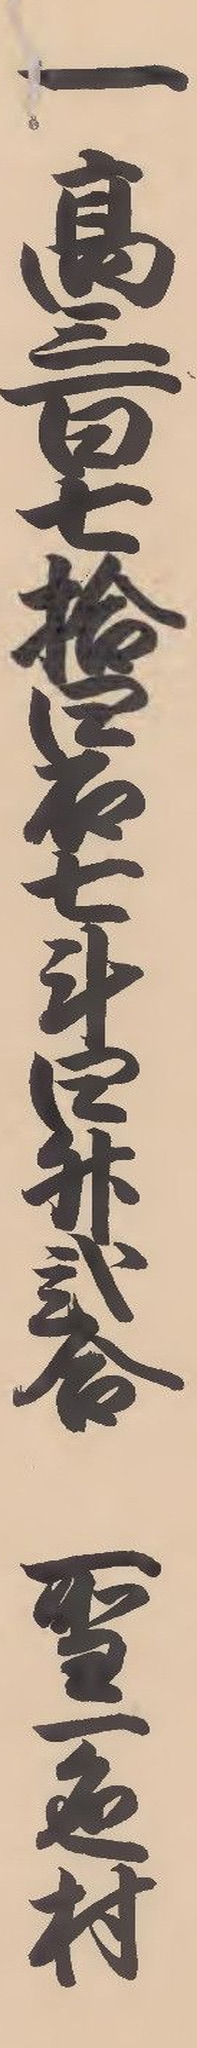一高三百七拾四石七斗四升弐合聖一色村
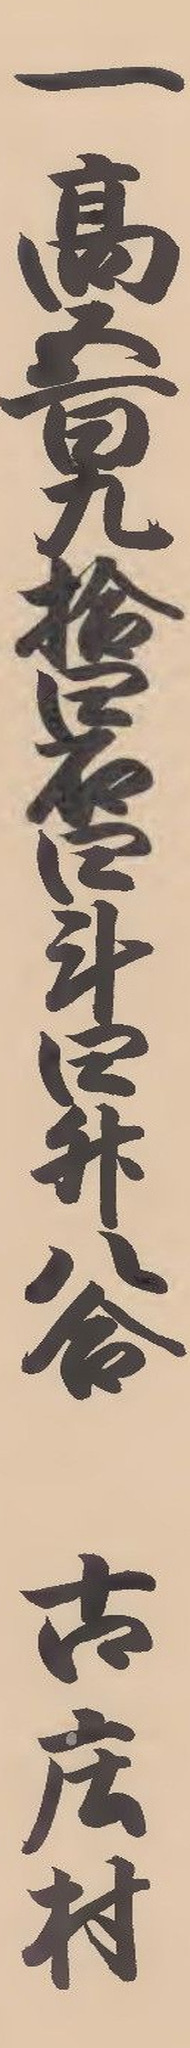一高五百九拾四石四斗四升八合古庄村
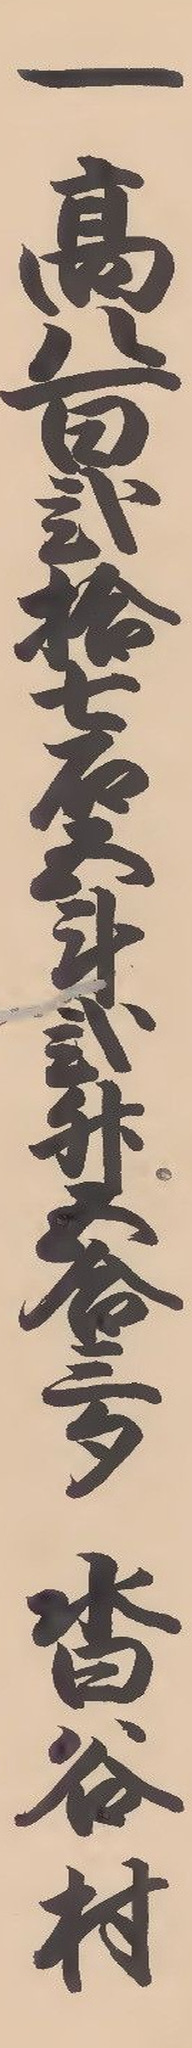一高八百弐拾七石五斗弐升五合三勺沓谷村
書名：駿河国郷帳
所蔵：国立公文書館 National Archives of Japan
